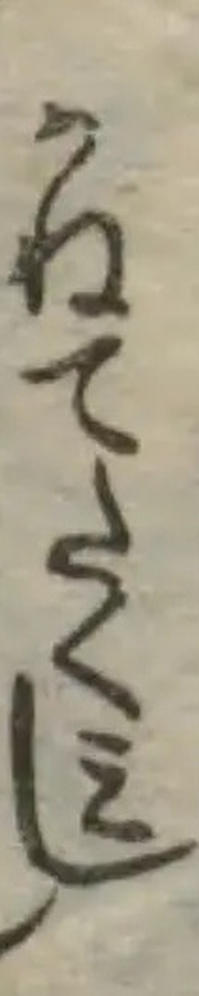かねてたくみし
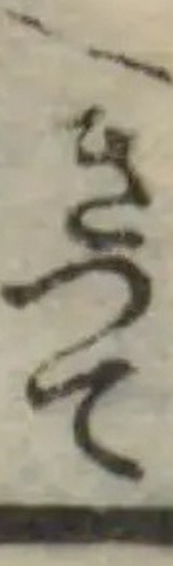きつて
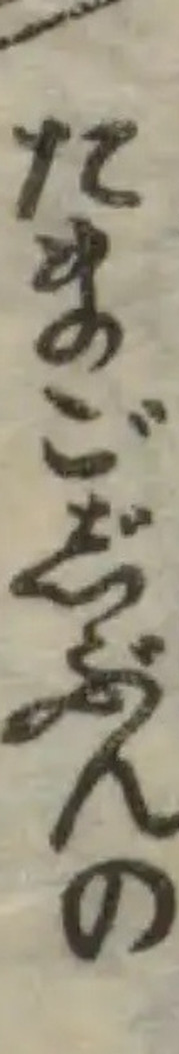たまごじぶんの
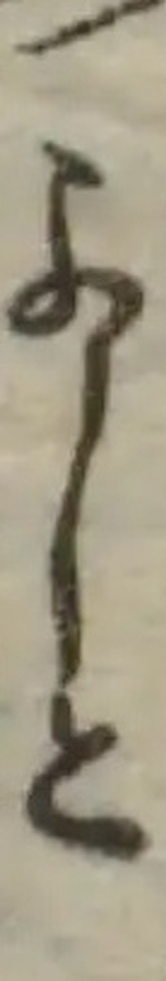よしと
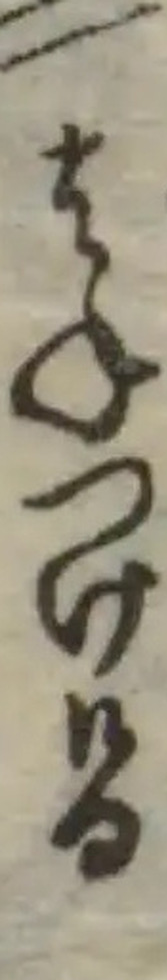はねつける
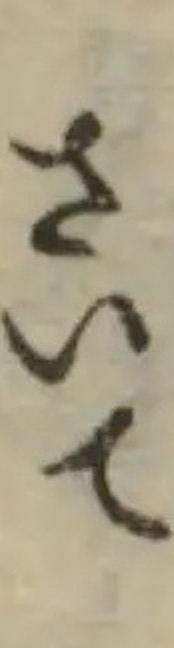さいて
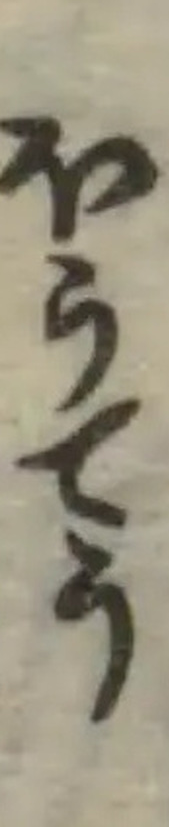ほうてう
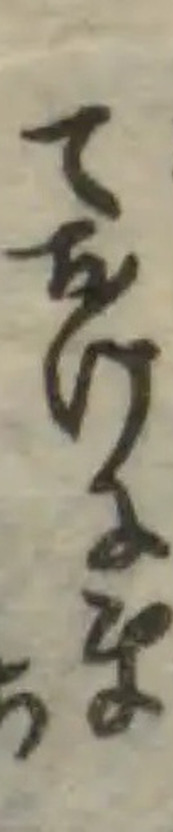ておけにま
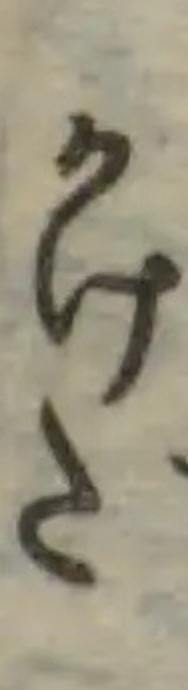かけた

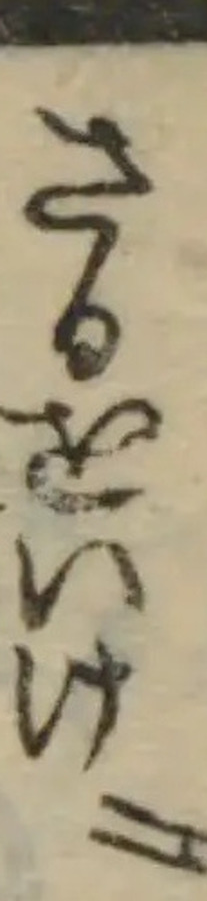さるをいけ
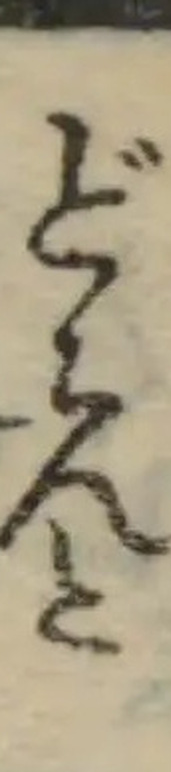どらんと
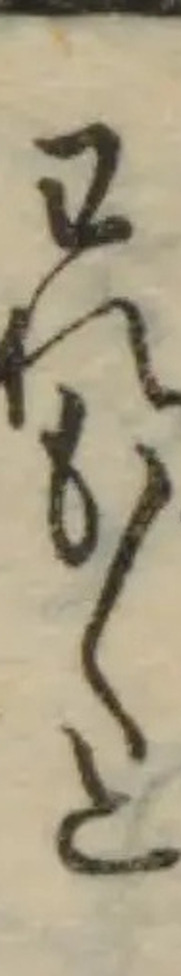われも〳〵と
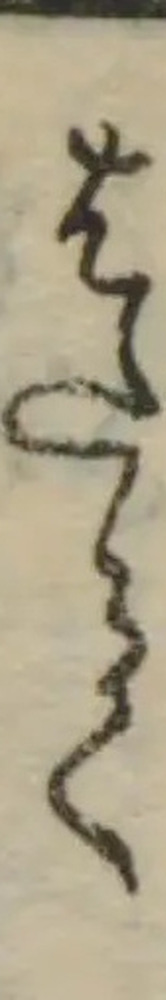はたらく
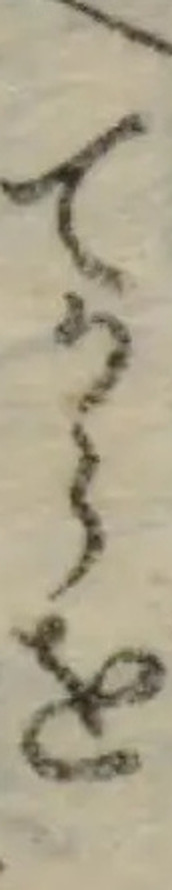てからを
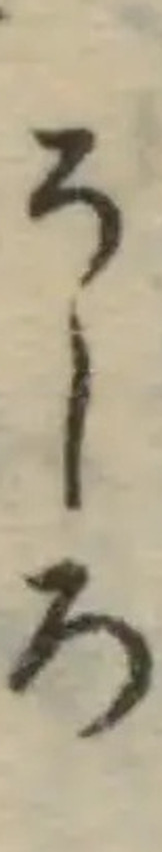うしろ
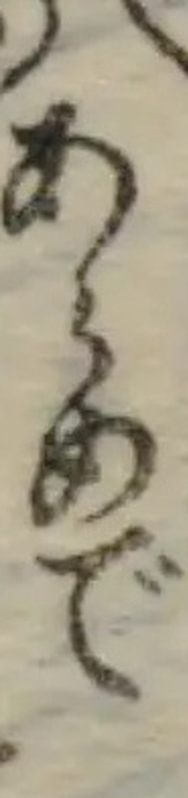あらめで
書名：さるかに合戦
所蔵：国立国会図書館 National Diet Library, JAPAN
